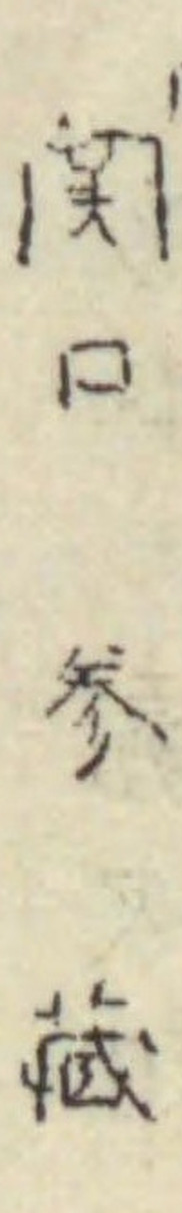関口参蔵
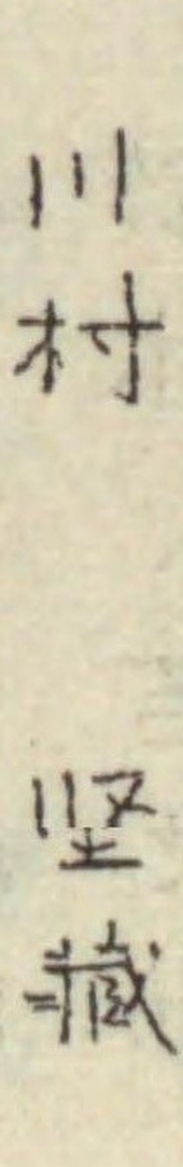川村堅蔵
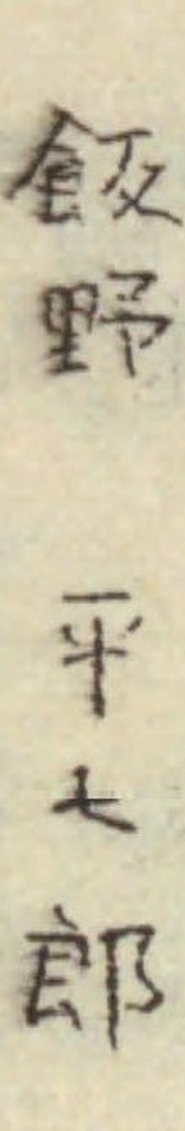飯野平七郎
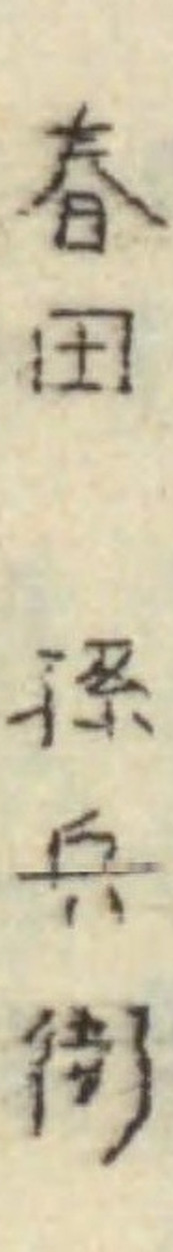春田孫兵衛
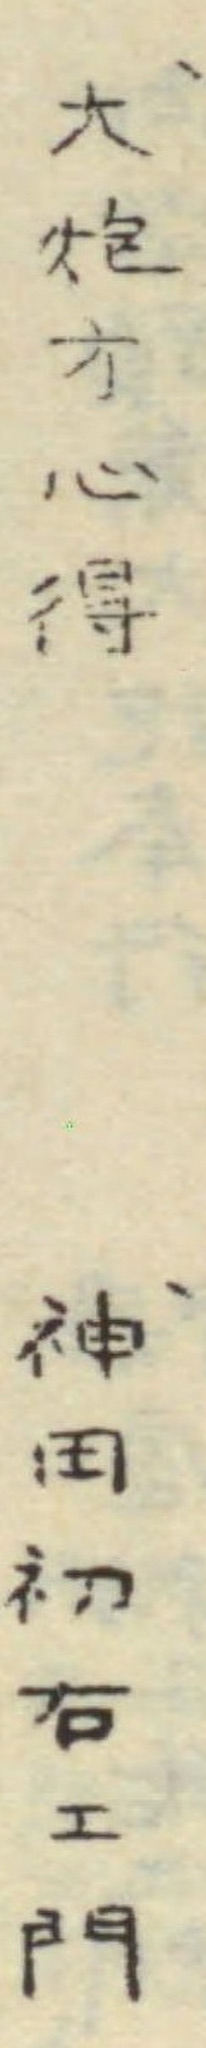大炮方心得神田初右エ門
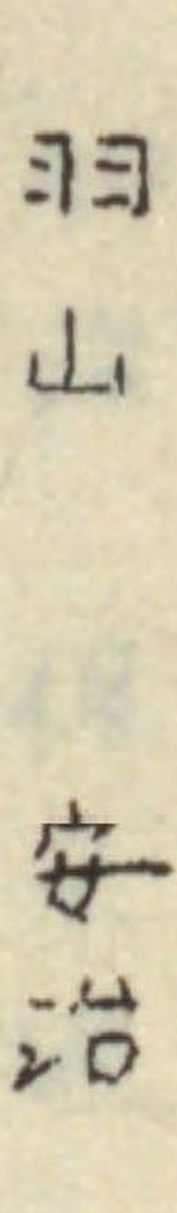羽山安治
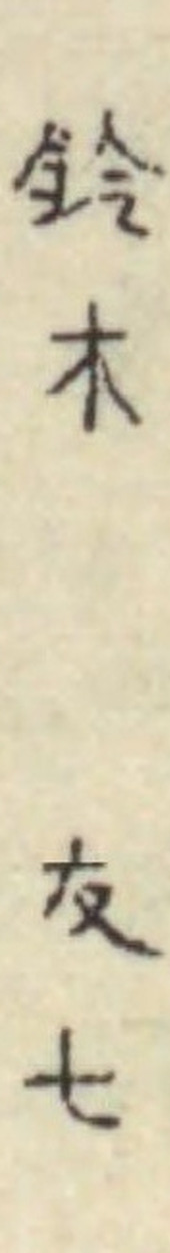鈴木友七
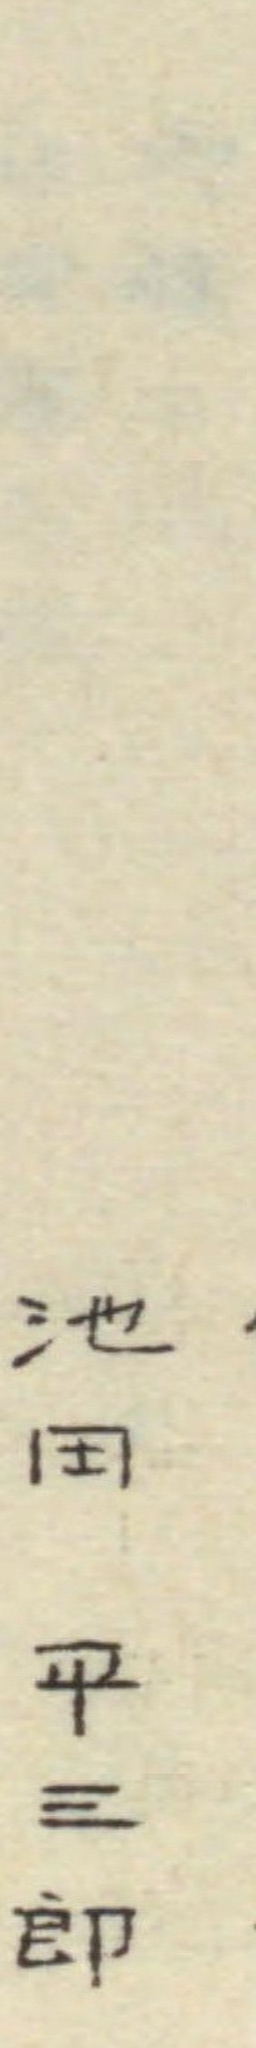池田平三郎
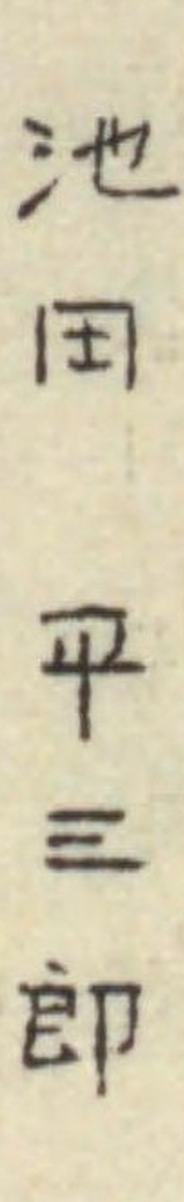池田平三郎
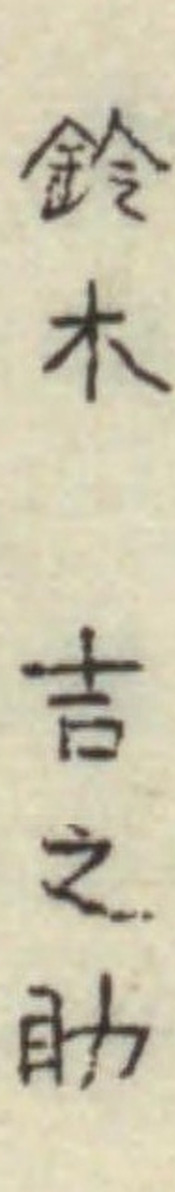鈴木吉之助
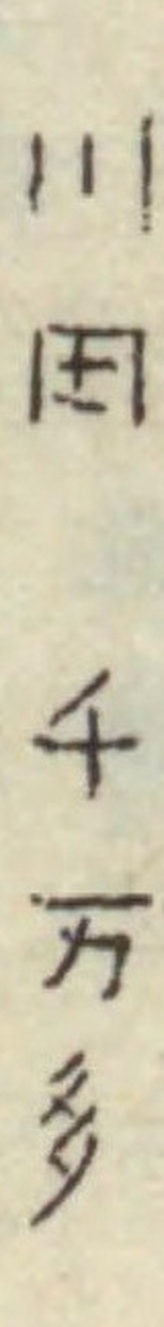川田千万多
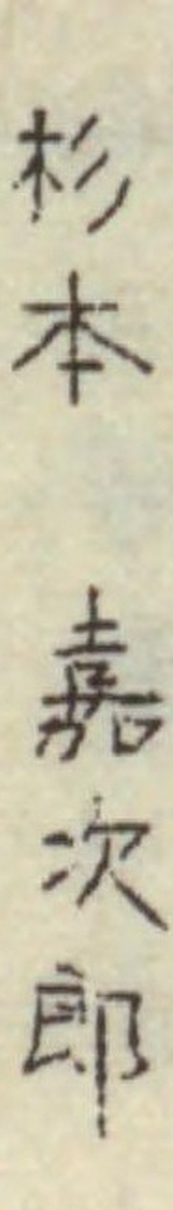杉本嘉次郎
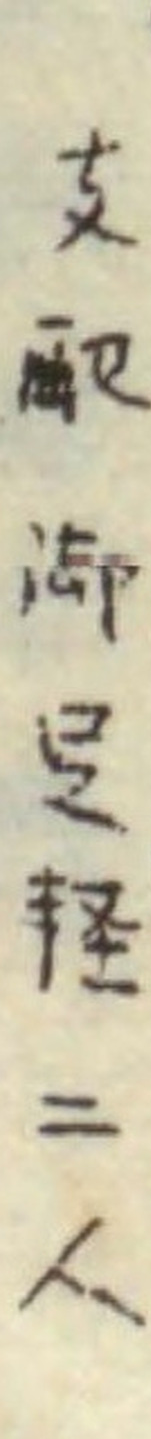支配御足軽二人
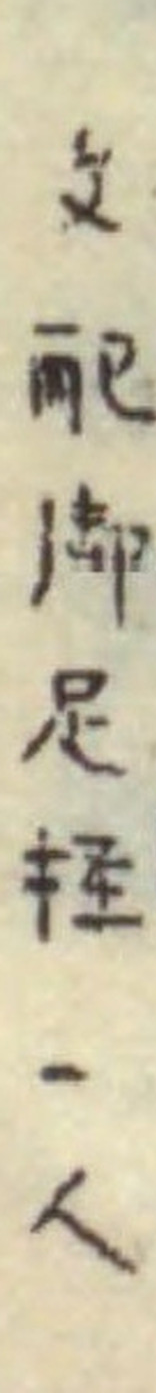支配御足軽一人
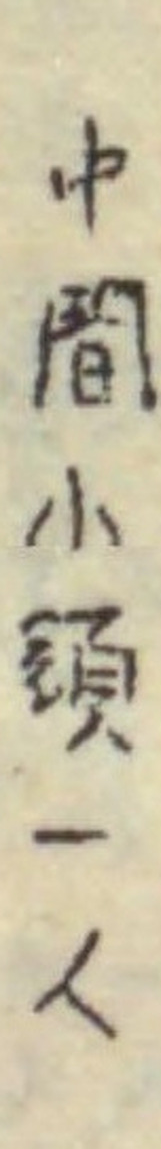中間小頭一人

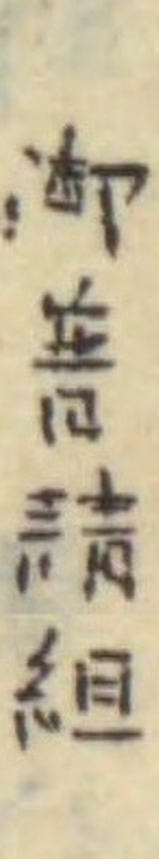御普請組
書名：三河吉田藩動員史料
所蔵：国立国会図書館 National Diet Library, JAPAN
